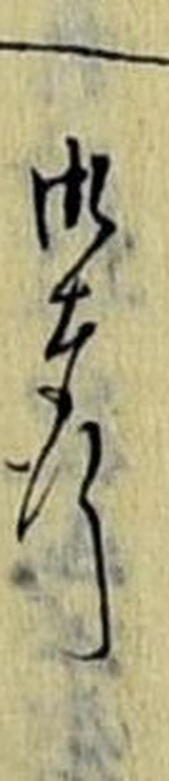御奉行
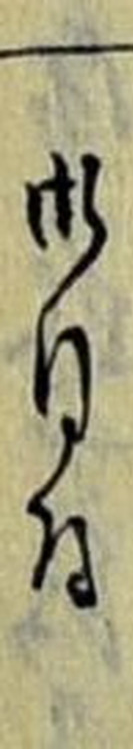御目付
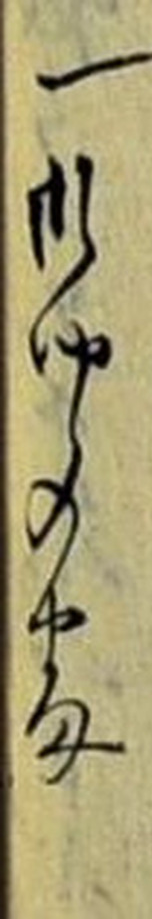御聞番
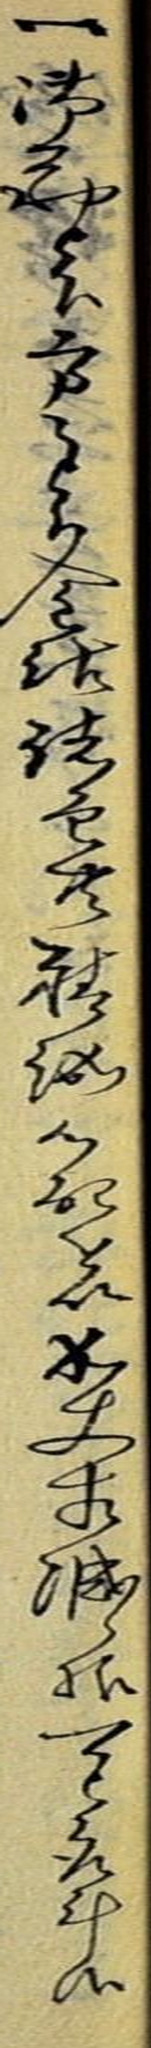一御勤被下方に被下金銀諸色共精誠心配を以成丈相減候様可被取斗候
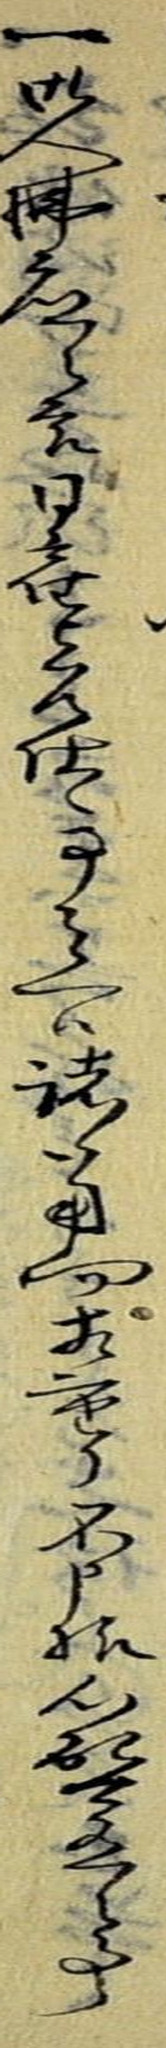一御人払底之節日雇被召仕候事に候へは諸御用向相重り不申様心配可有之事
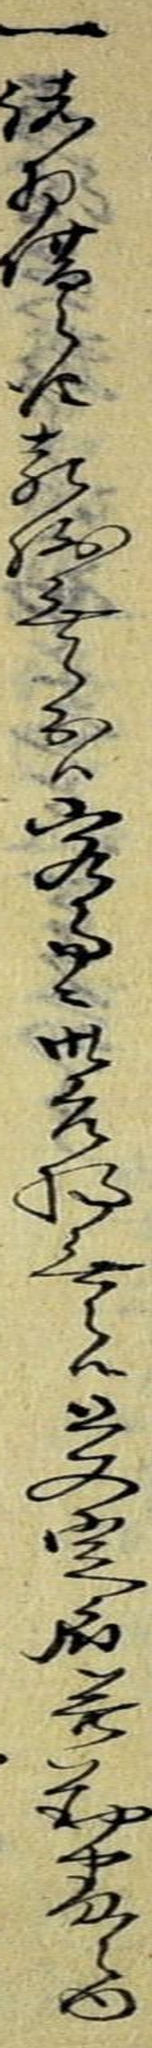一諸拝借之儀類別無之分は究事に御取揚無之候且又定府并勤番之内
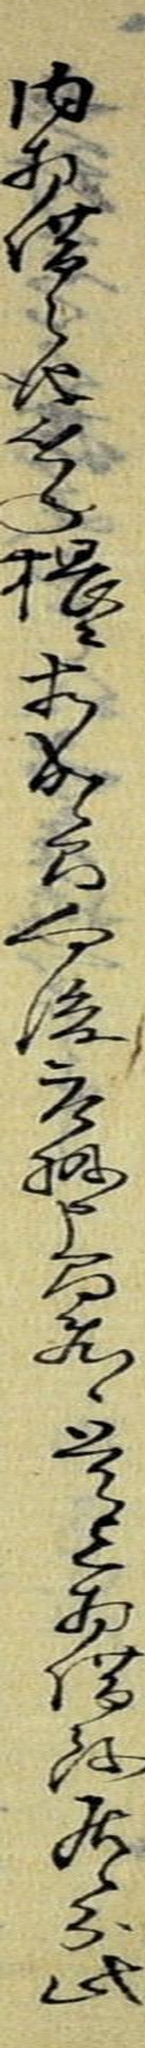内拝借之儀近年猥に相成候間向後取扱申間敷候是迄拝借致居候分此
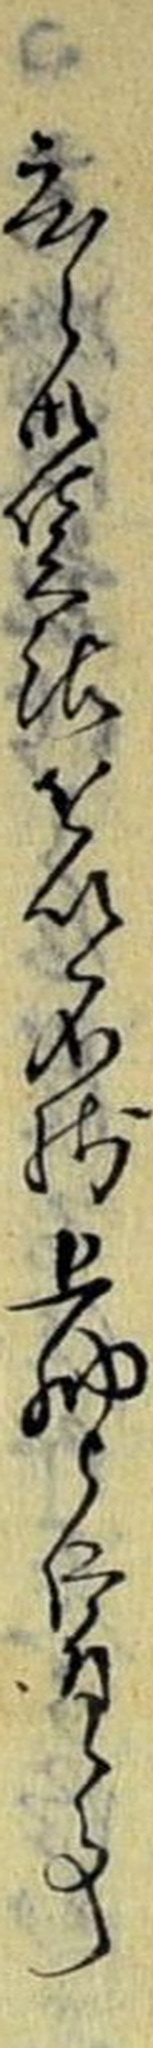度之御貸銀を以不残上納被仰付候事
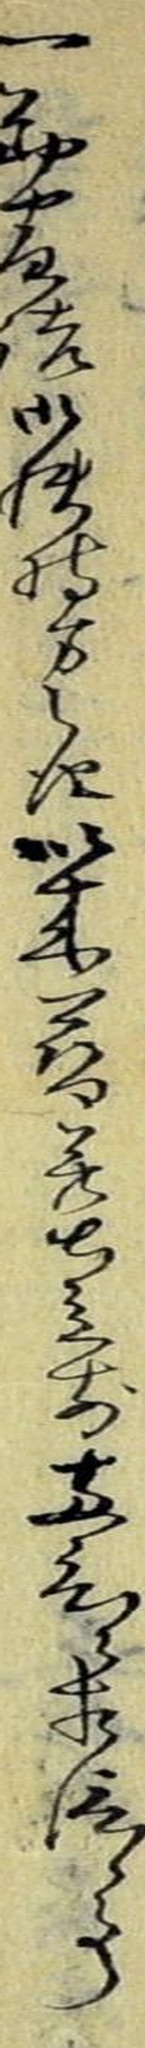一勤番詰御扶持方之儀以来暮并出立前両度に相渡候事
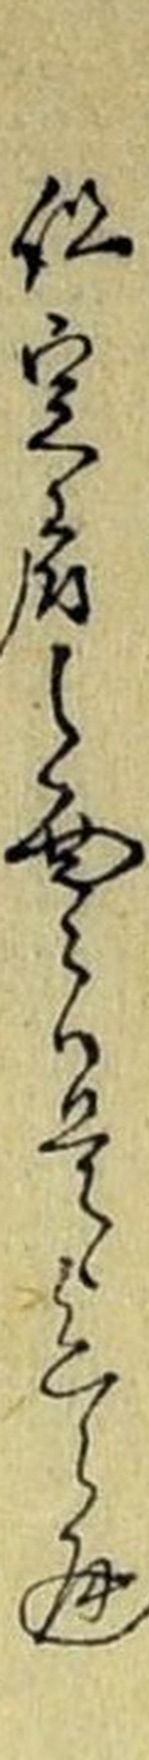但定府之面々は是迄之通
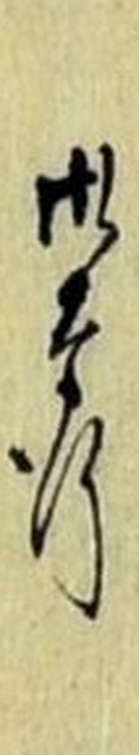御奉行
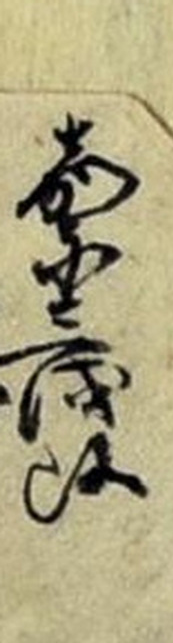嘉永三戌改
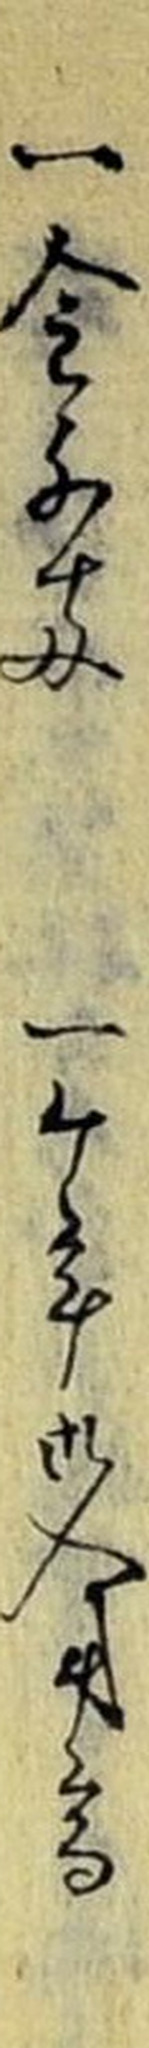一金千両一ヶ年御入用高
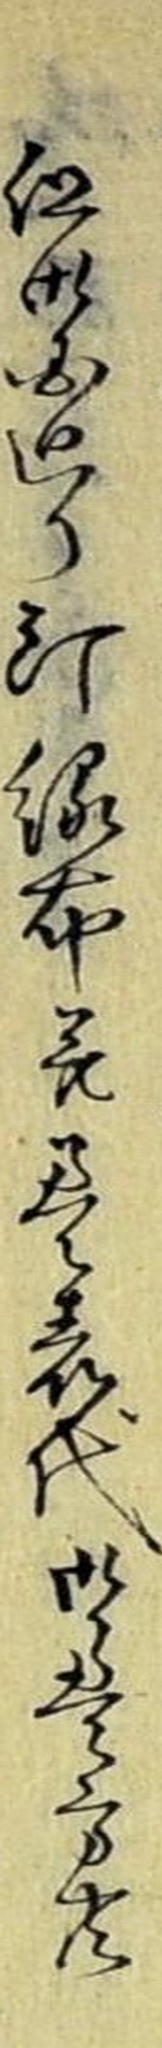但御国廻り釘綿布并畳之表代御畳方共
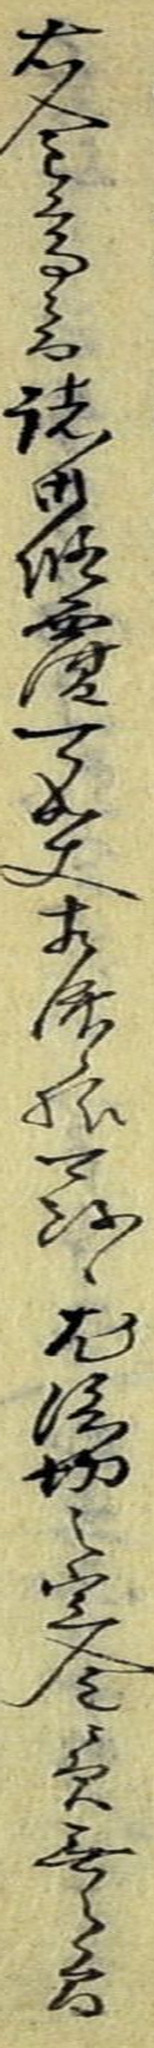右金高に而諸修覆可成丈相済候様可致候尤渡切之定金に而は無之候間
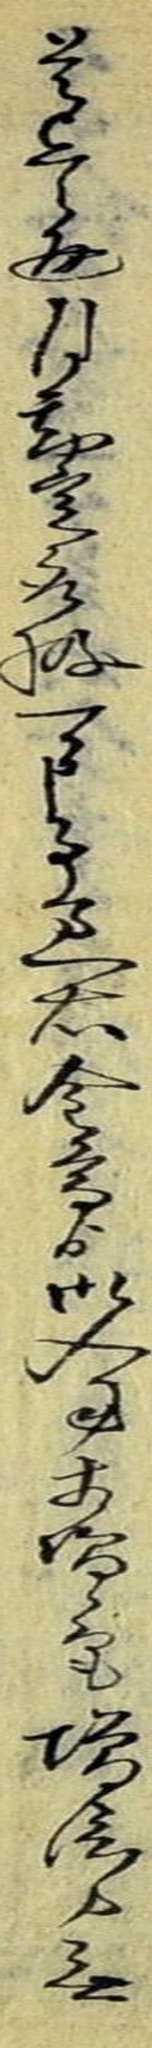是迄之通月勘定取扱可申事万一右金高ゟ御入用相増候而も増渡方無
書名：命令之部 四
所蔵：福井県文書館 Fukui Prefectural Archives
